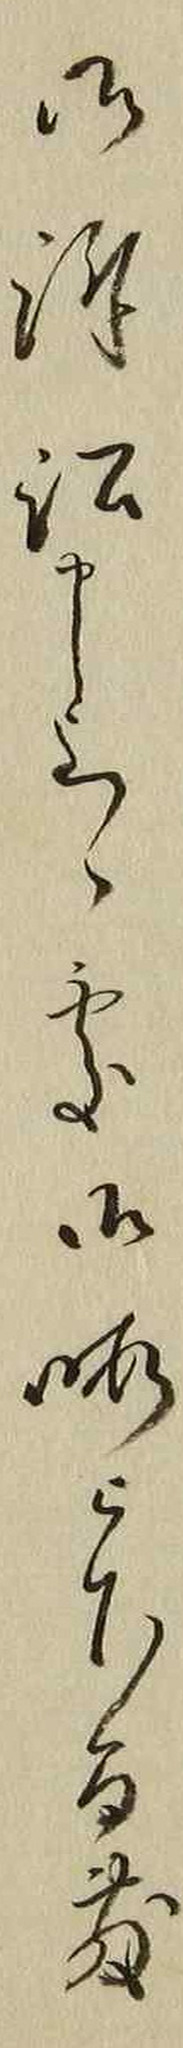御訴訟申上候処御暇被下間敷
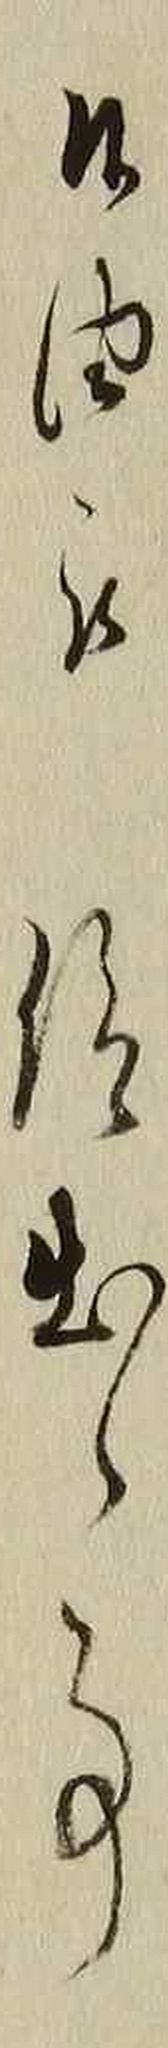候由被仰出候事
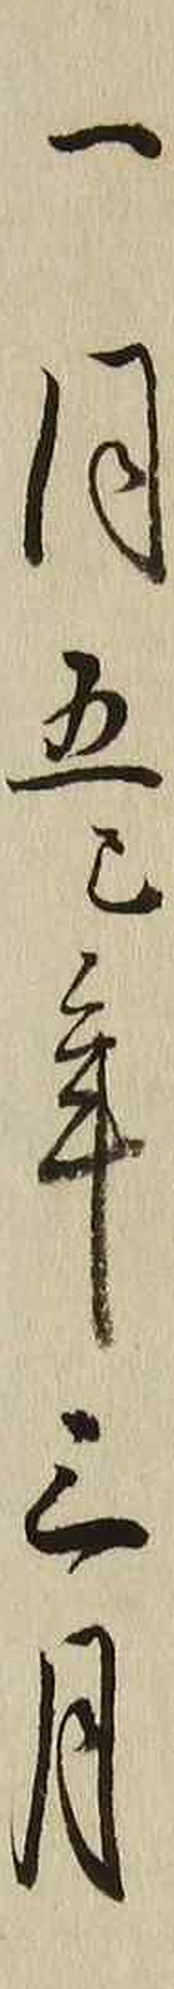一同五年巳三月
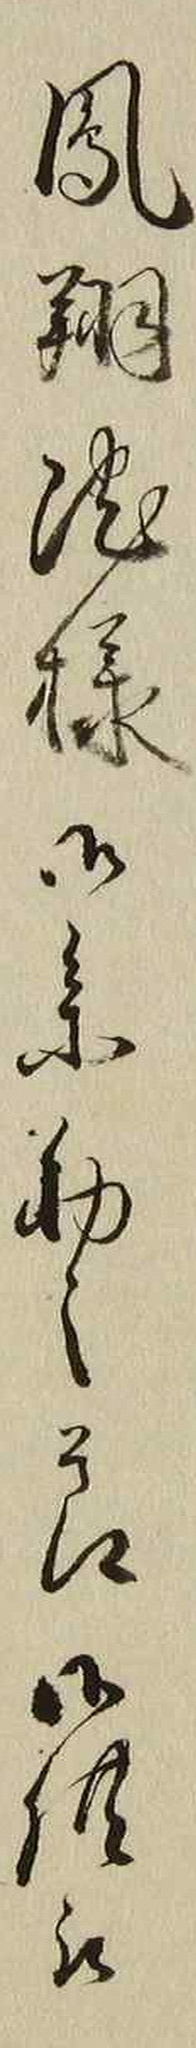鳳翔院様御参勤之節御供被
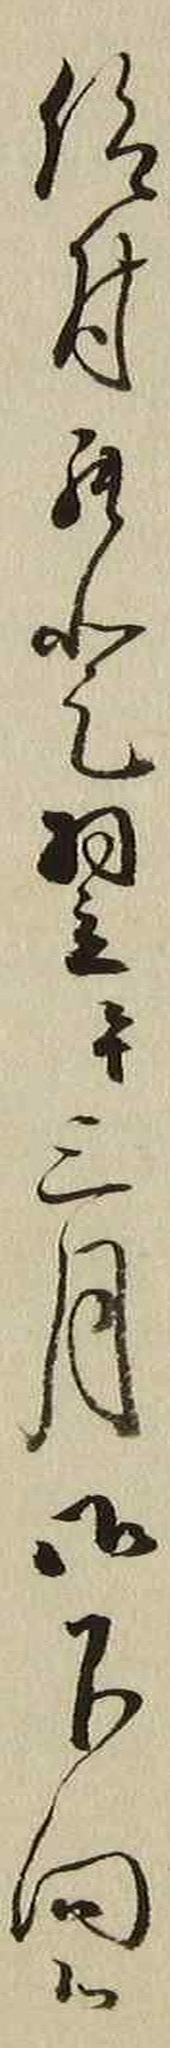仰付罷登翌午三月御下向御
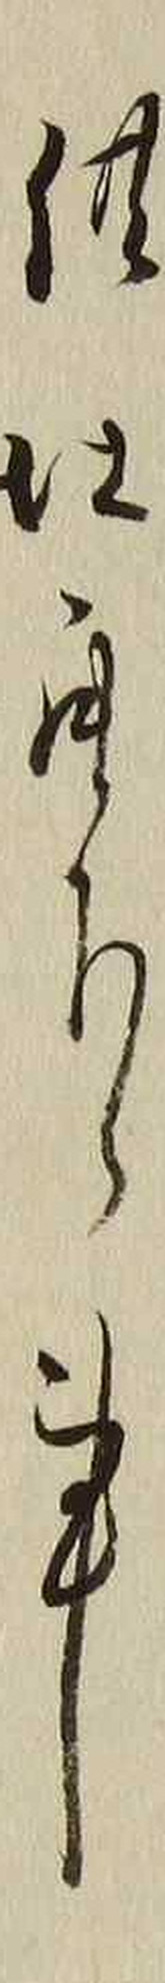供仕罷下候事
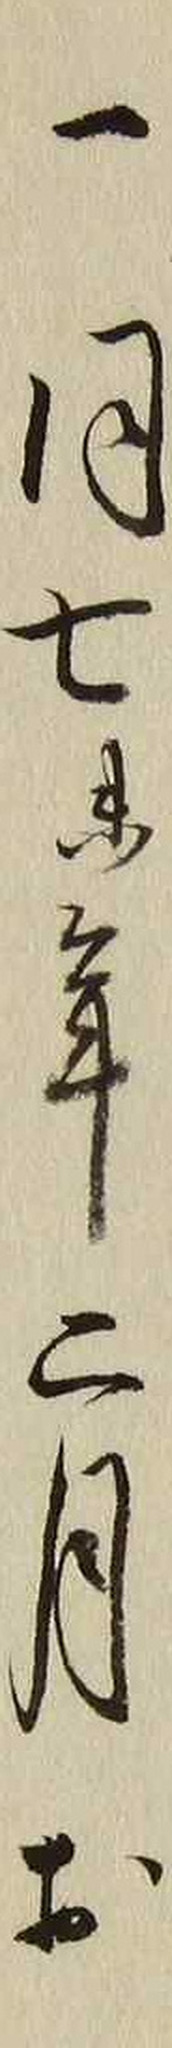一同七未年二月於
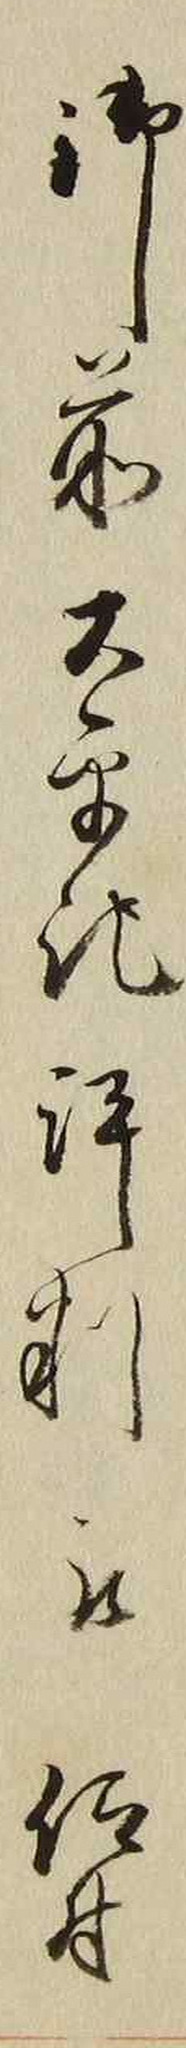御前大平記評判被仰付
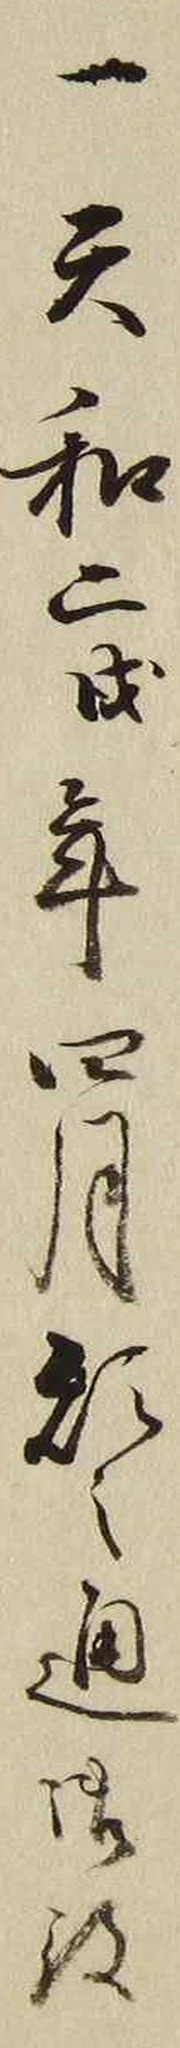一天和二戌年四月願之通御役
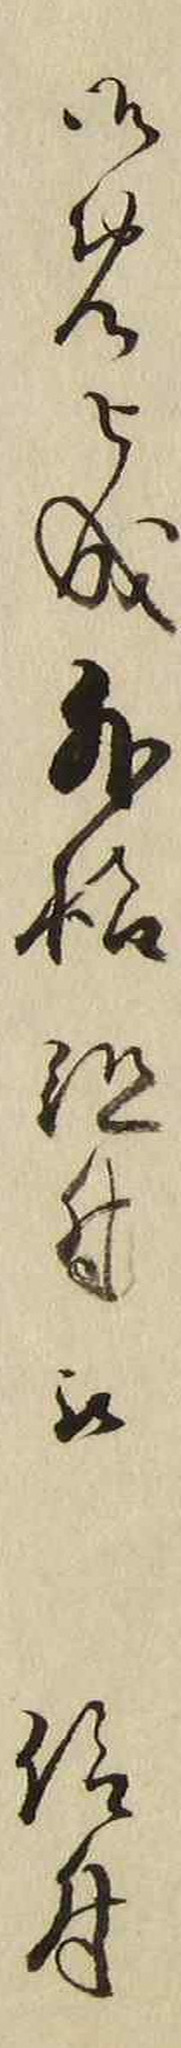御免被成外様組付被仰付
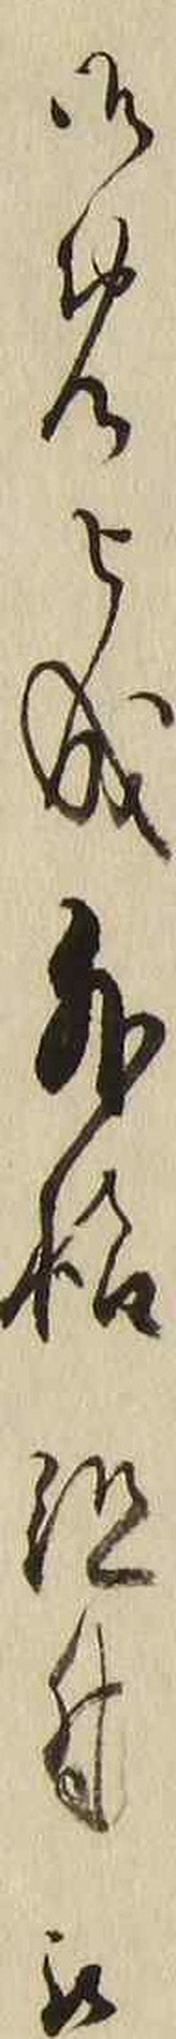御免被成外様組付被仰付

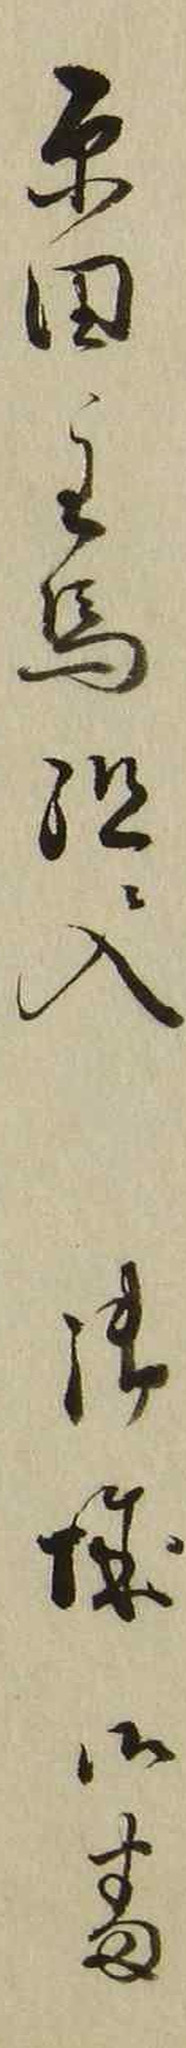原田主馬組ニ入御城御番
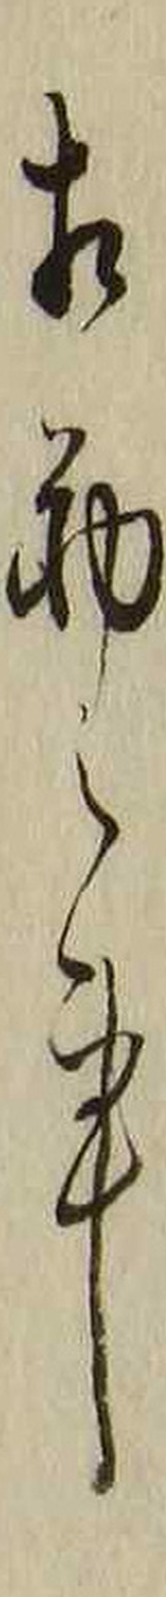相勤之事
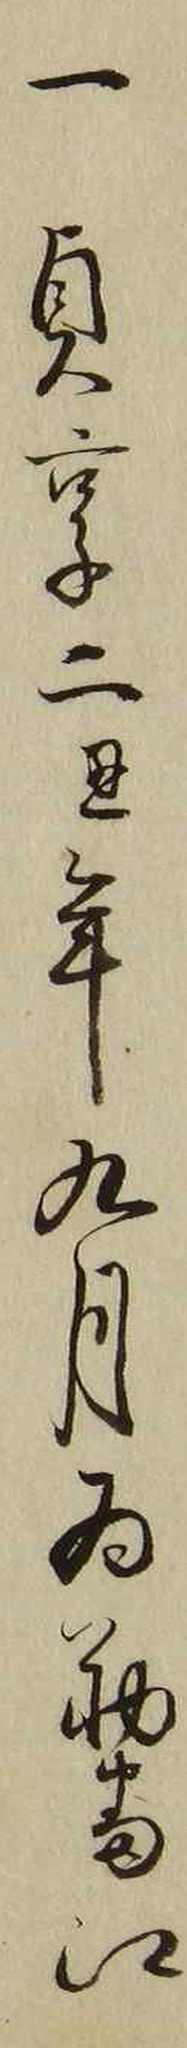一貞享二丑年九月為勤番江
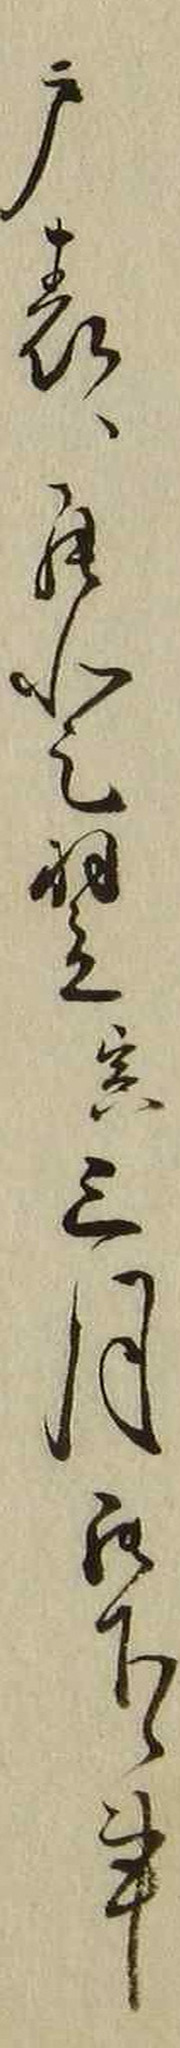戸表へ罷登翌寅三月罷下候事
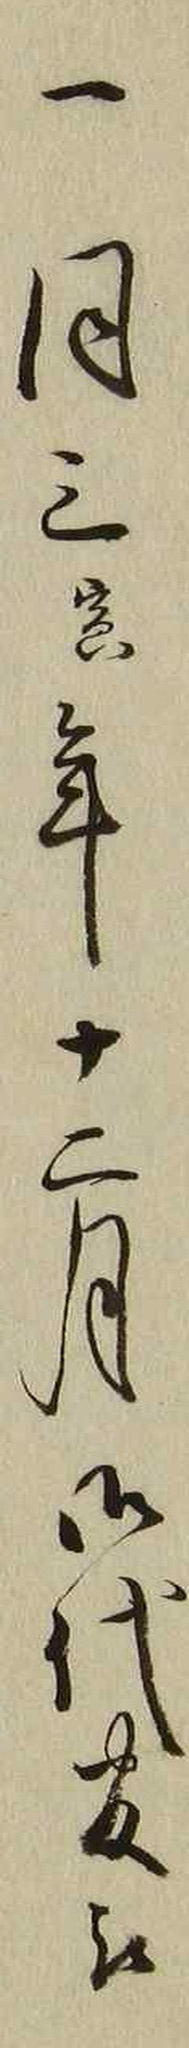一同三寅年十二月御代官被
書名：諸士系譜　巻之1　い之部1
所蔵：会津若松市立会津図書館
